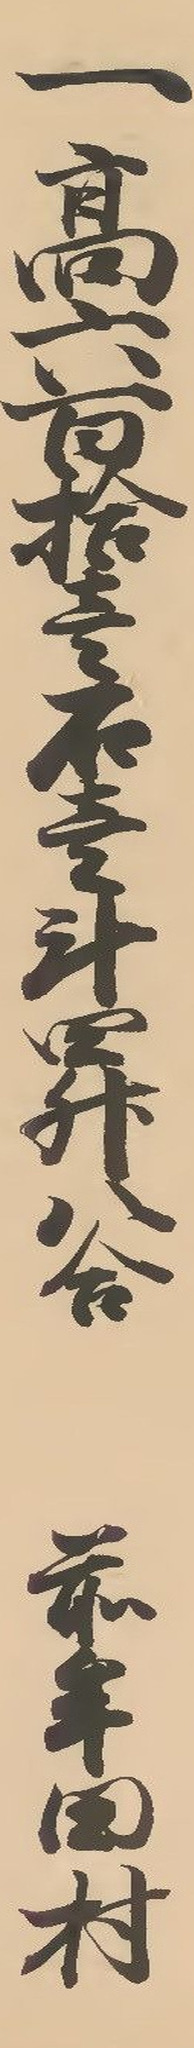一髙六百拾壱石壱斗四升八合前牟田村
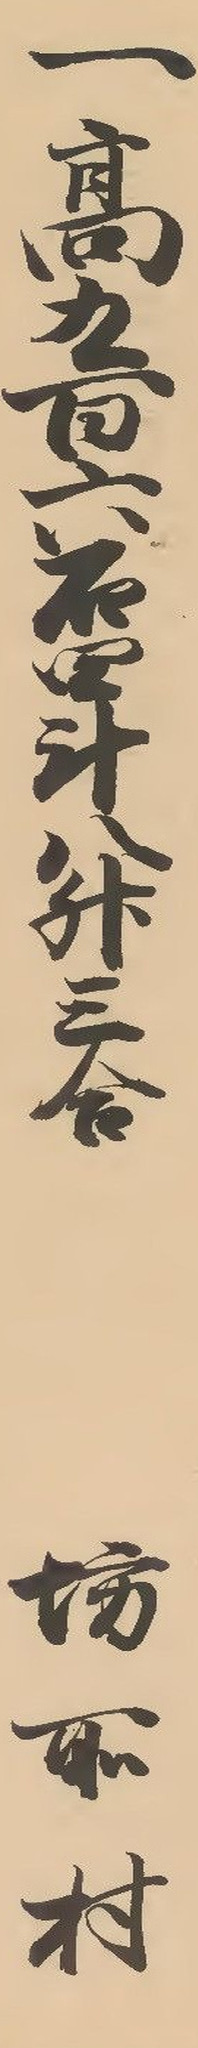一髙九百六石四斗八升三合坊所村

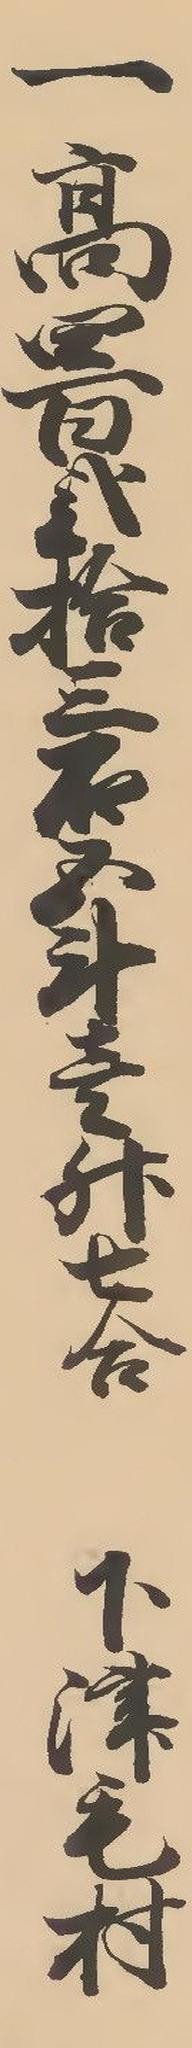一髙四百弐拾三石五斗壱升七合下津毛村
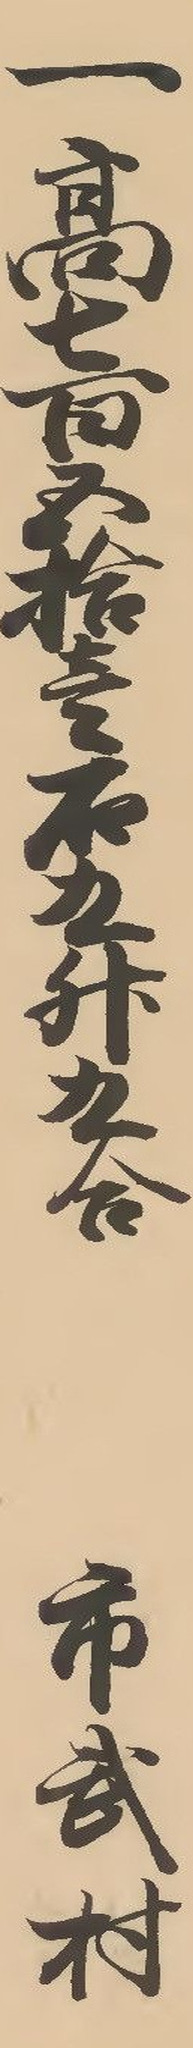一髙七百五拾壱石九升九合市武村
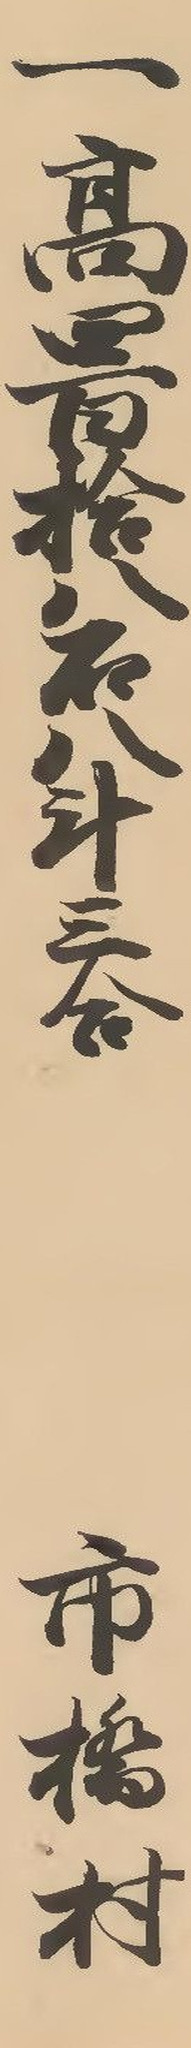一髙四百拾八石八斗三合市橋村
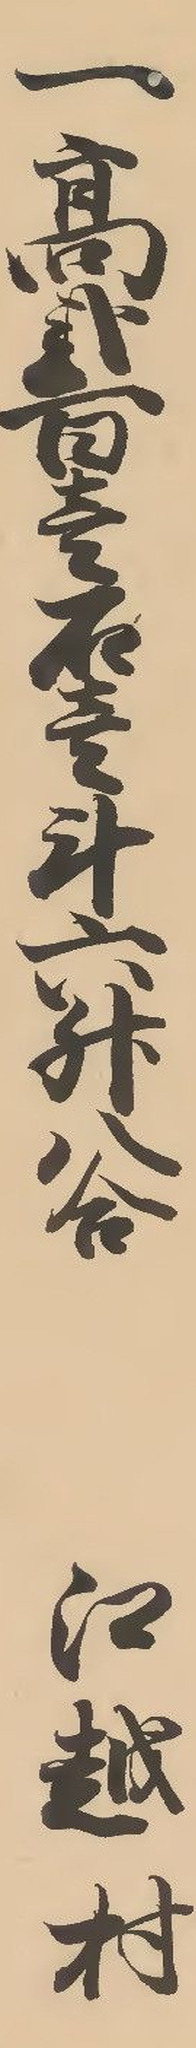一髙弐百壱石壱斗六升八合江越村
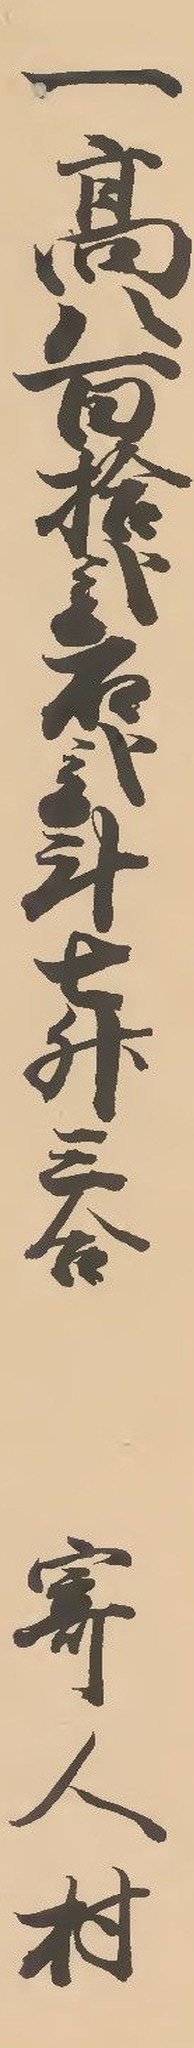一髙八百拾弐石弐斗七升三合寄人村
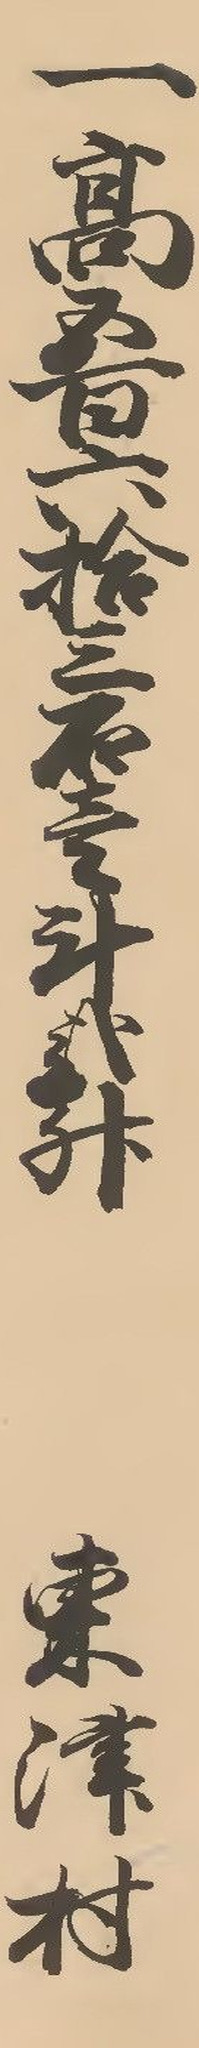一髙五百六拾三石壱斗弐升東津村
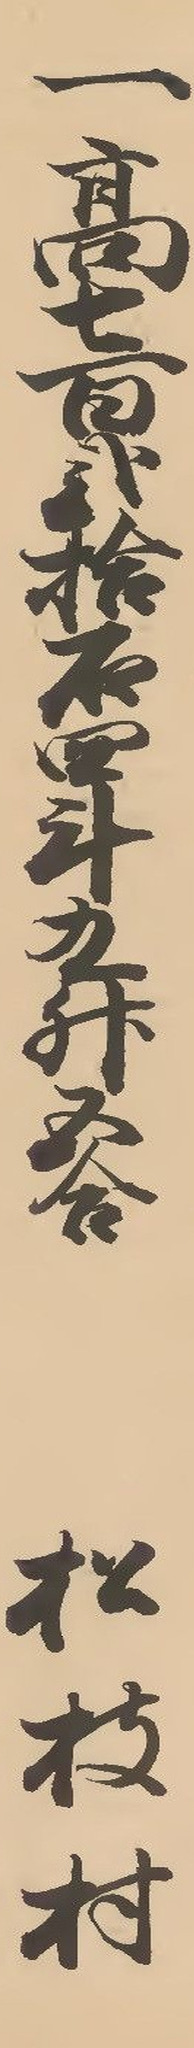一髙七百弐拾石四斗九升五合松枝村
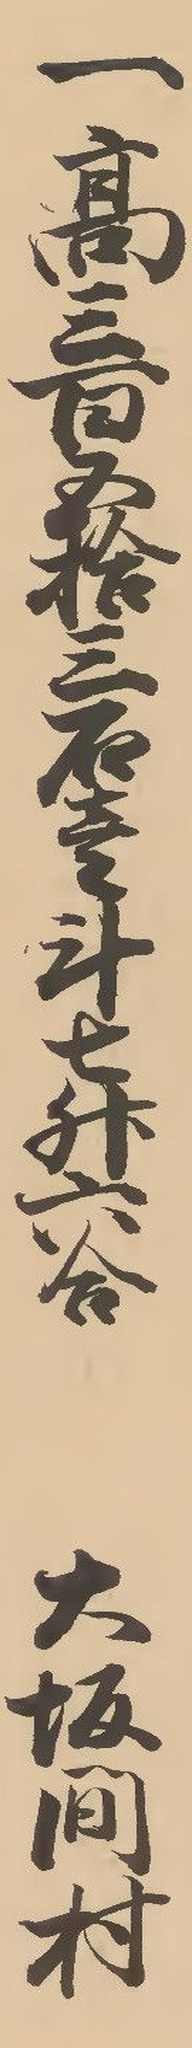一髙三百五拾三石壱斗七升六合大坂間村

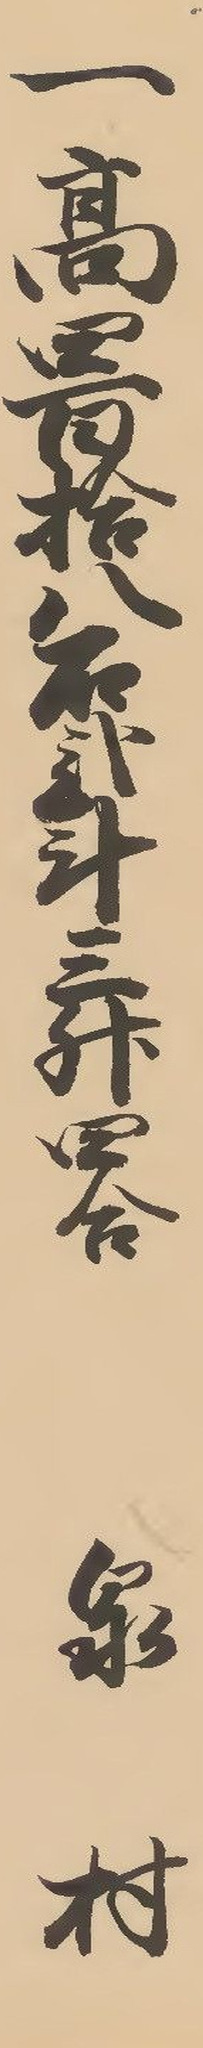一髙四百拾八石弐斗三升四合泉村
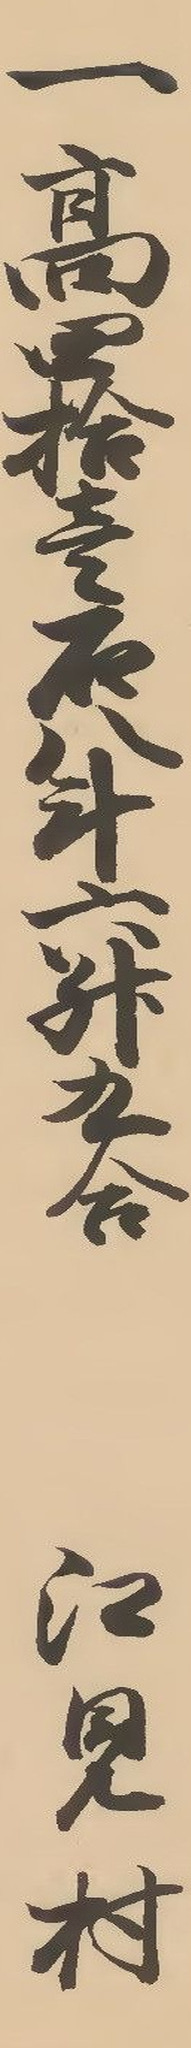一髙四拾壱石八斗六升九合江見村
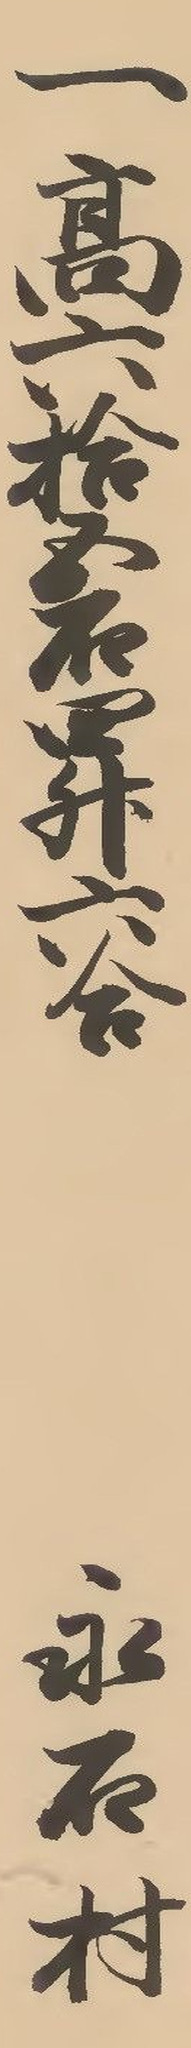一髙六拾五石四升六合永石村
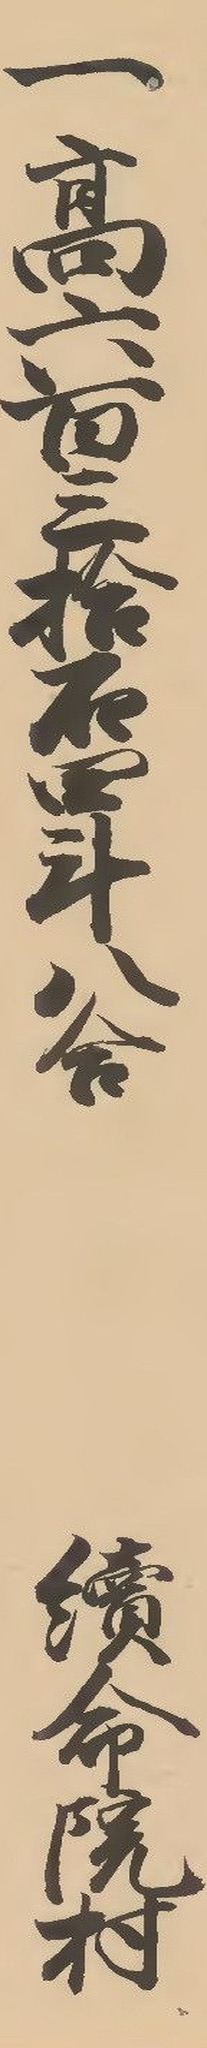一髙六百三拾石四斗八合続命院村
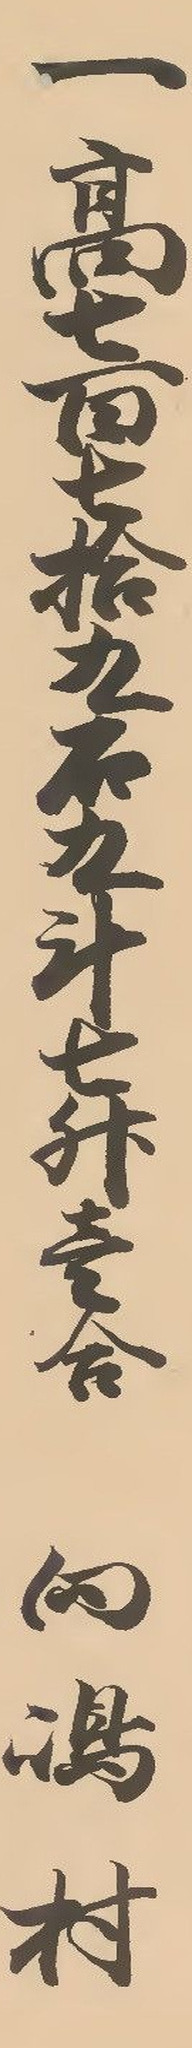一髙七百七拾九石九斗七升壱合向嶋村
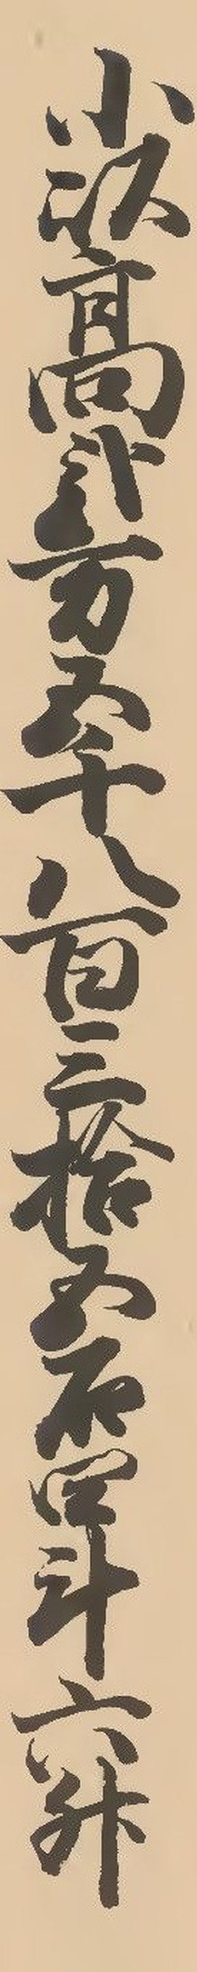小以髙弐万五千八百三拾五石四斗六升
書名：肥前国郷帳
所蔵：国立公文書館 National Archives of Japan
